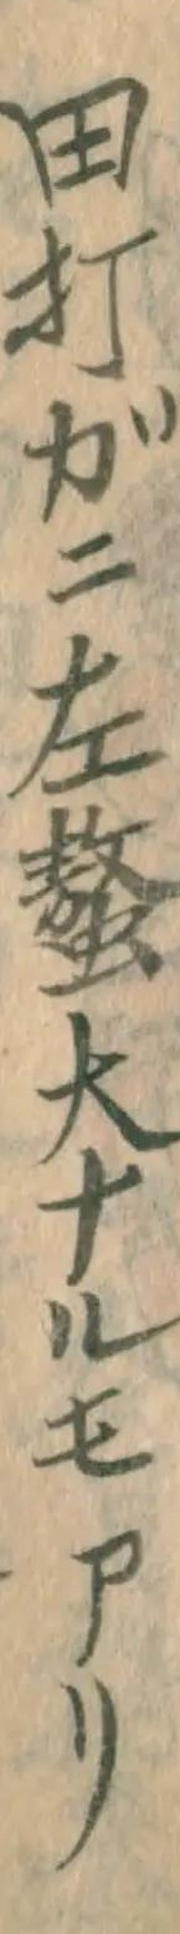田打ガニ左螯大ナルモアリ
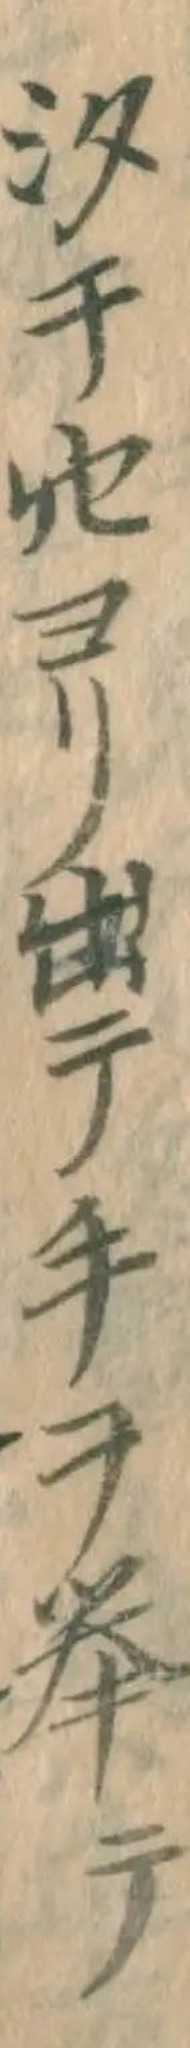汐干穴ヨリ出テ手ヲ挙テ
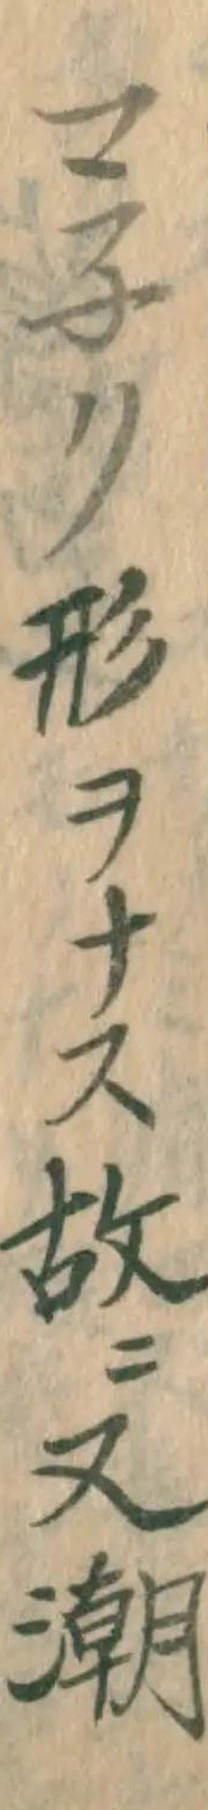マネク形ヲナス故ニ又潮
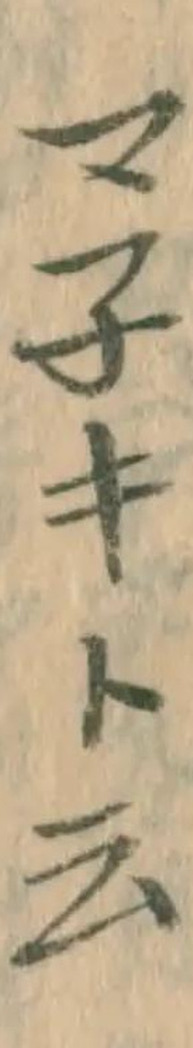マネキト云

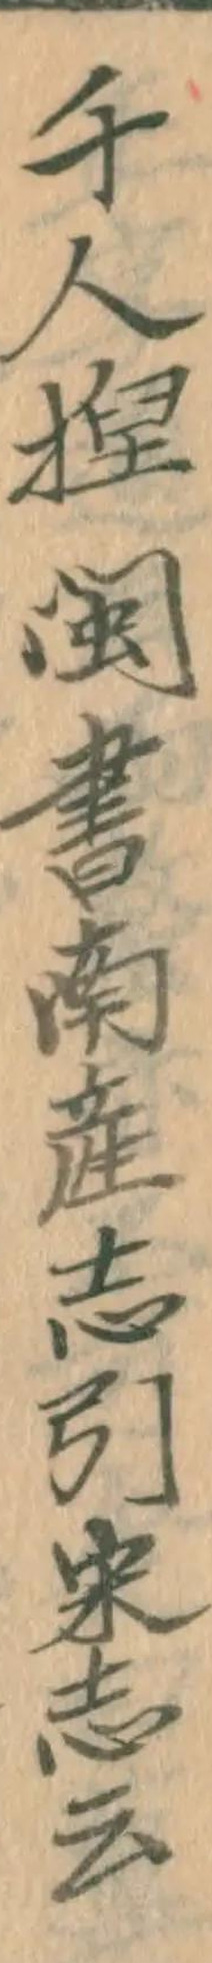千人捏閩書南産志引宋志云
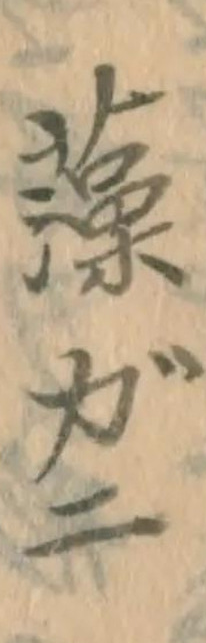藻ガニ
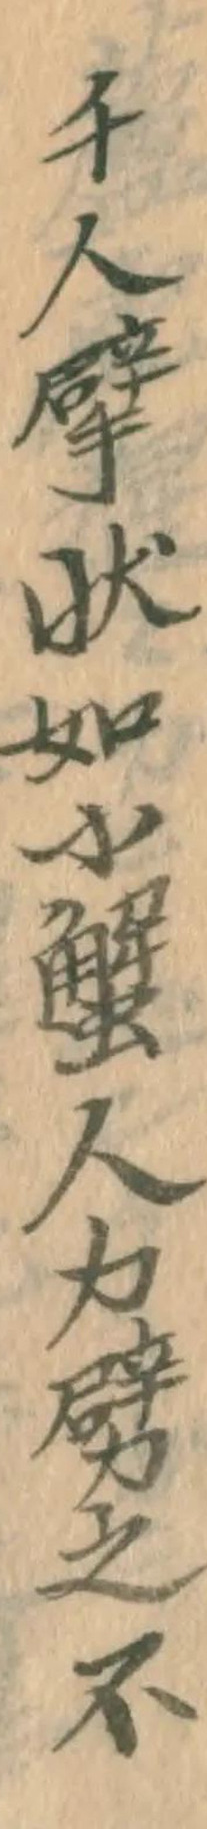千人擘状如小蟹人力劈之不
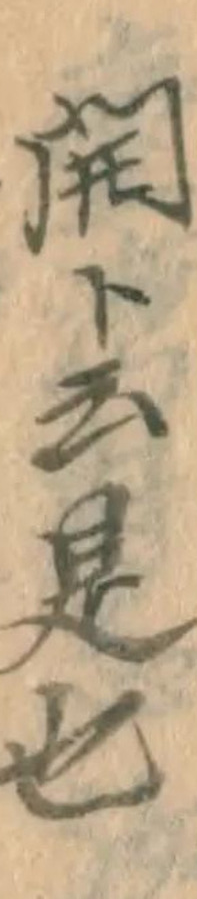開ト云是也
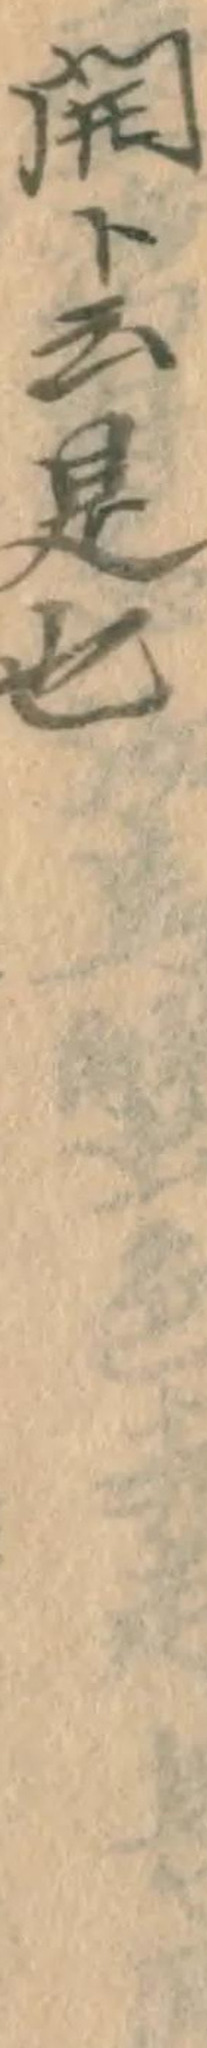開ト云是也
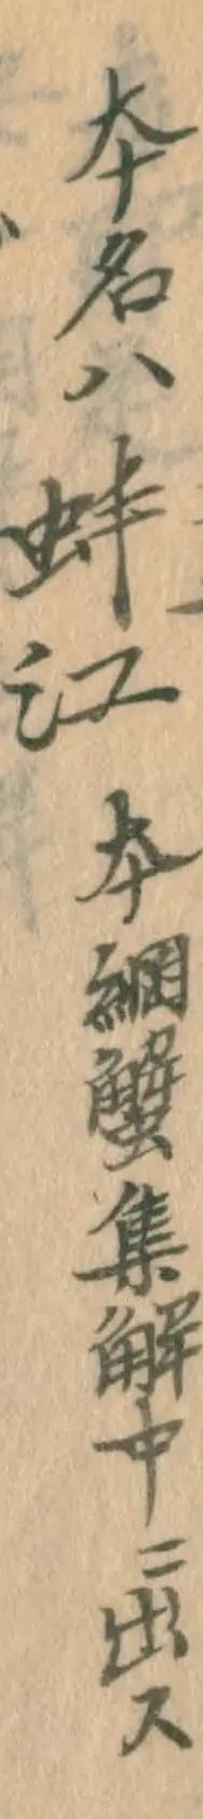本名ハ蚌江本綱蟹集解中ニ出ス
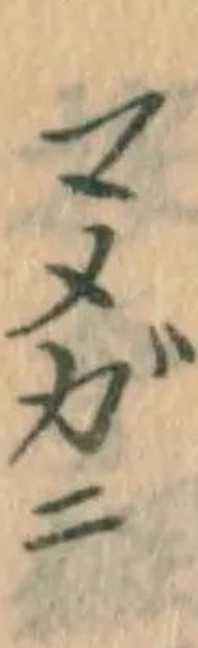マメガニ
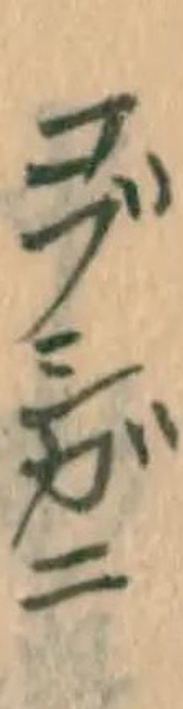コブシガニ
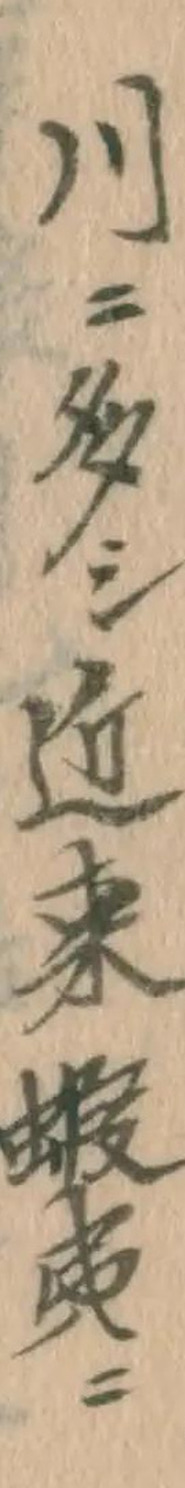川ニ多シ近来蝦夷ニ
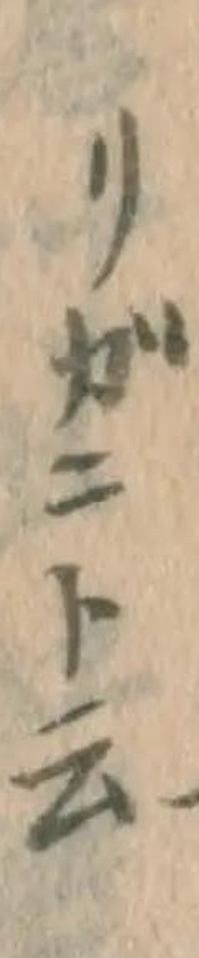リガニト云
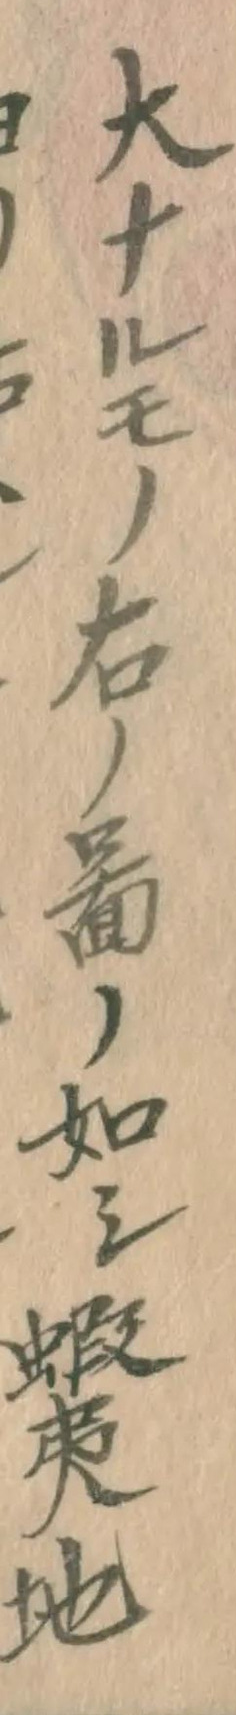大ナルモノ右ノ啚ノ如シ蝦夷地
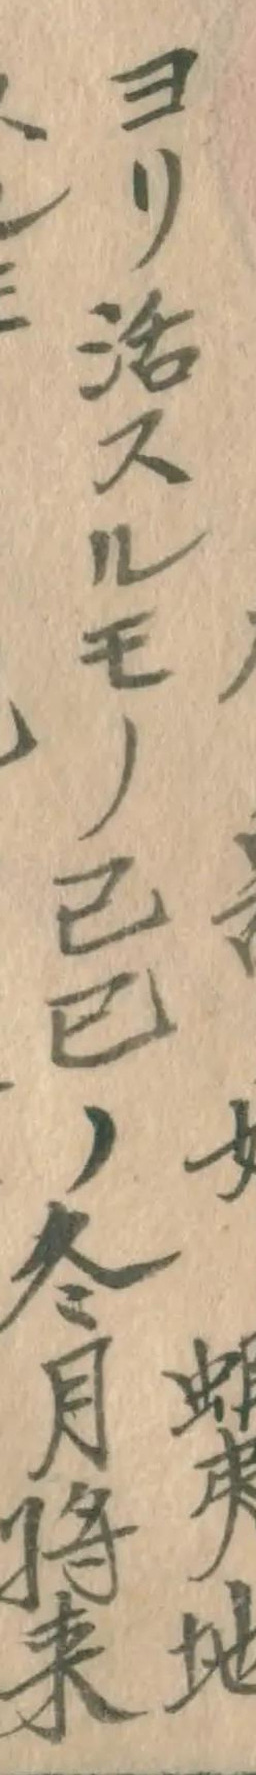ヨリ活スルモノ己巳ノ冬月将来
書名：千蟲譜 3巻. [2]
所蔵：国立国会図書館 National Diet Library, JAPAN
